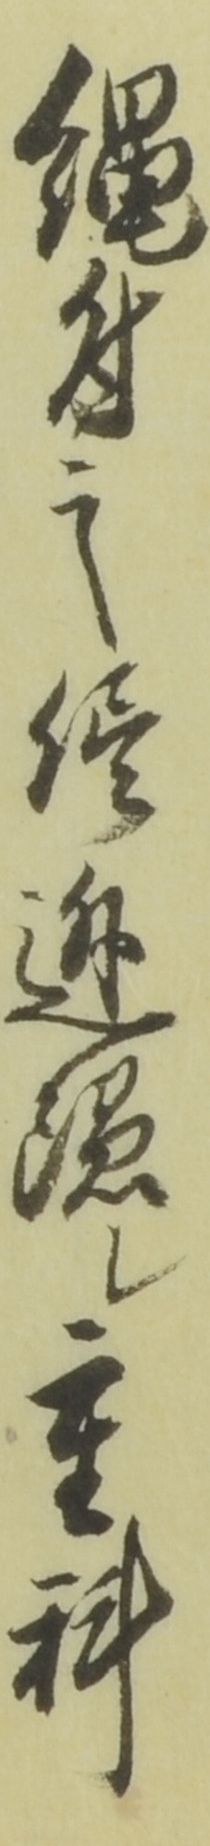縄付之侭逃隠レ重科
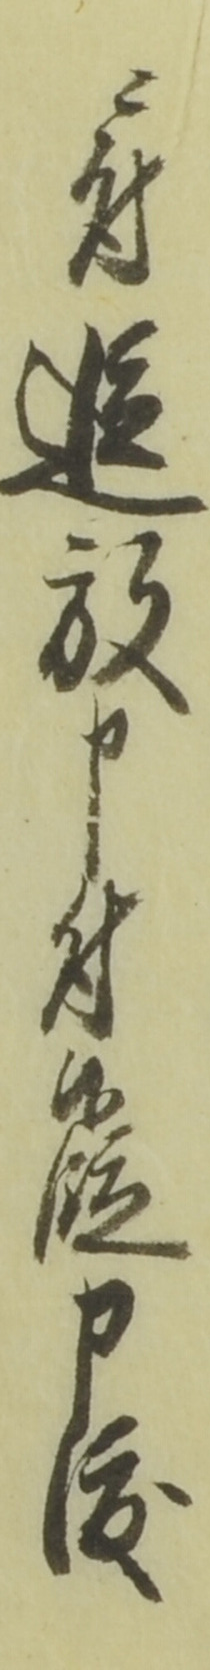ニ付追放申付候段申渡
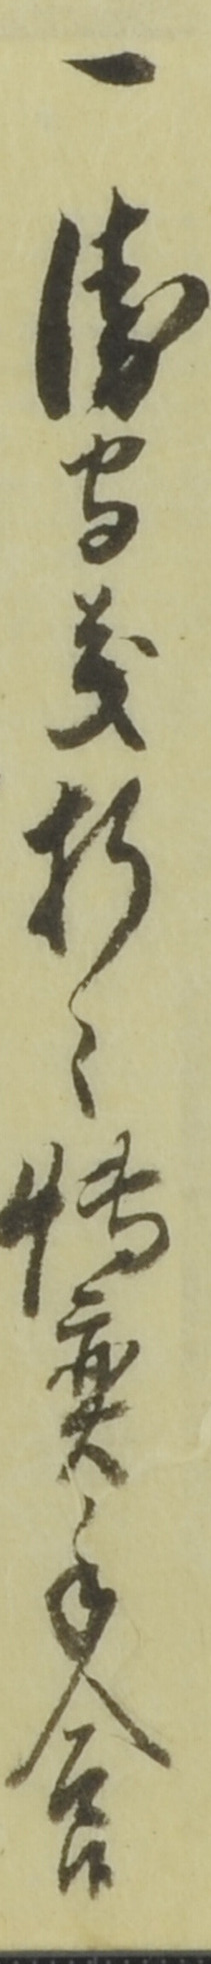一勝守義折々博奕手合候
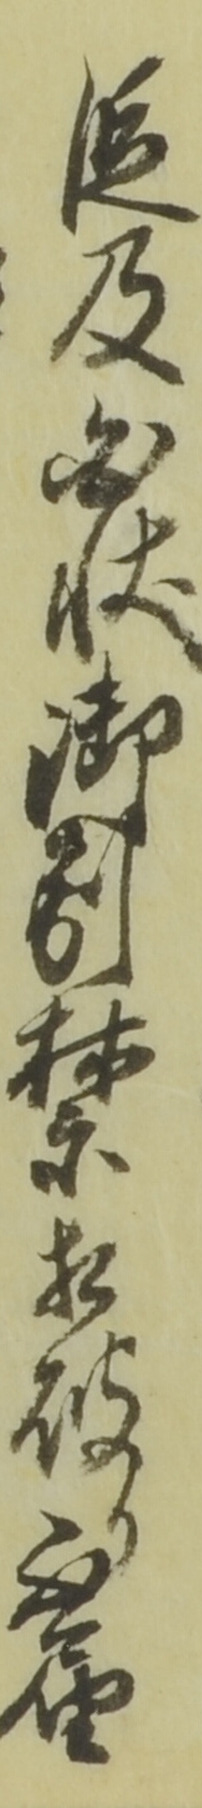段及白状御制禁相破り不届
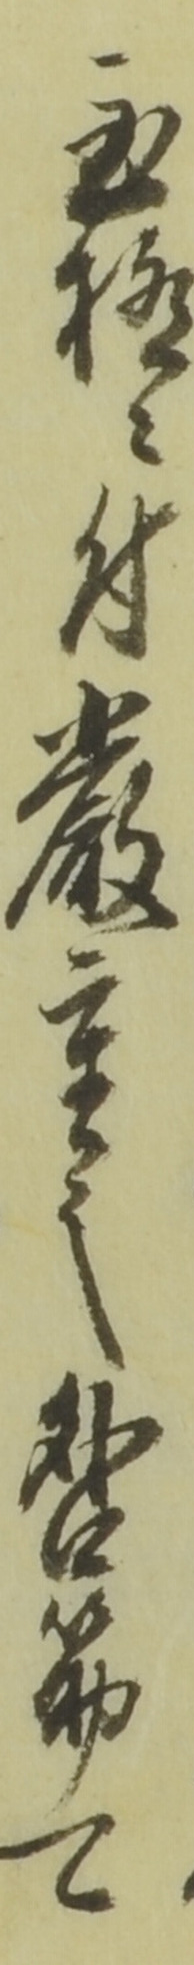至極ニ付厳重之咎筋可
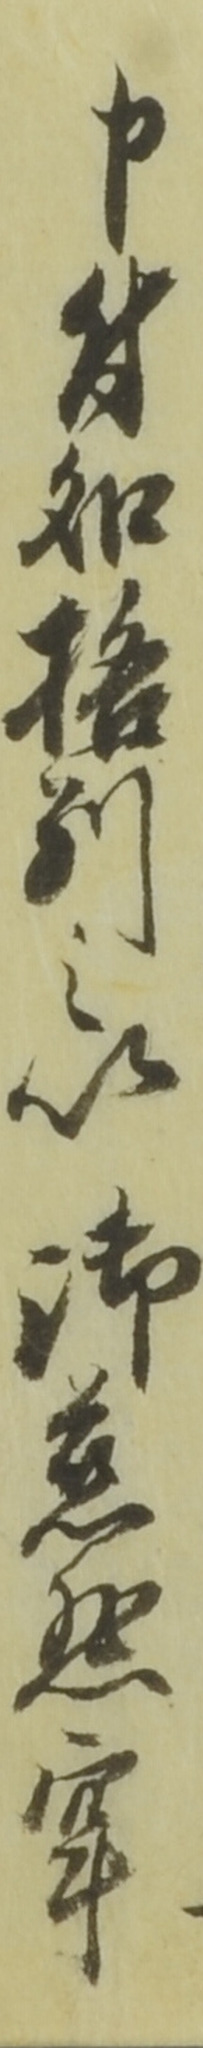申付処格別之以御慈悲窂
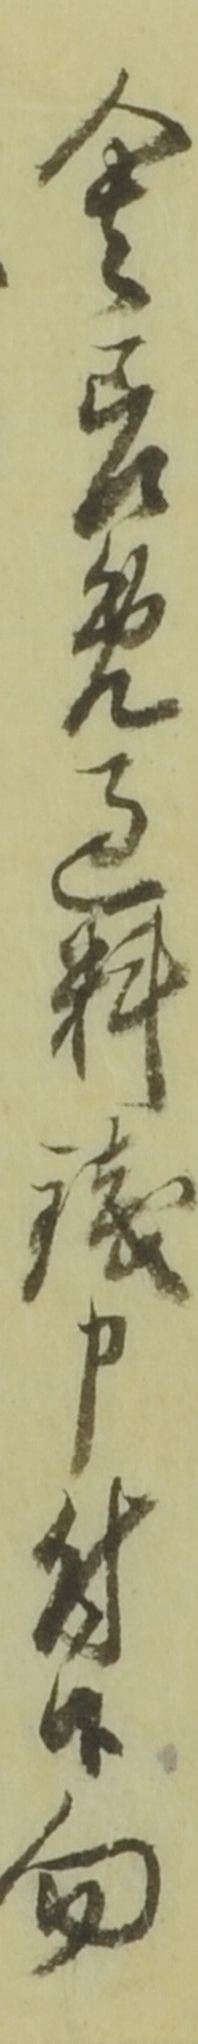舎差免過料銭申付候向
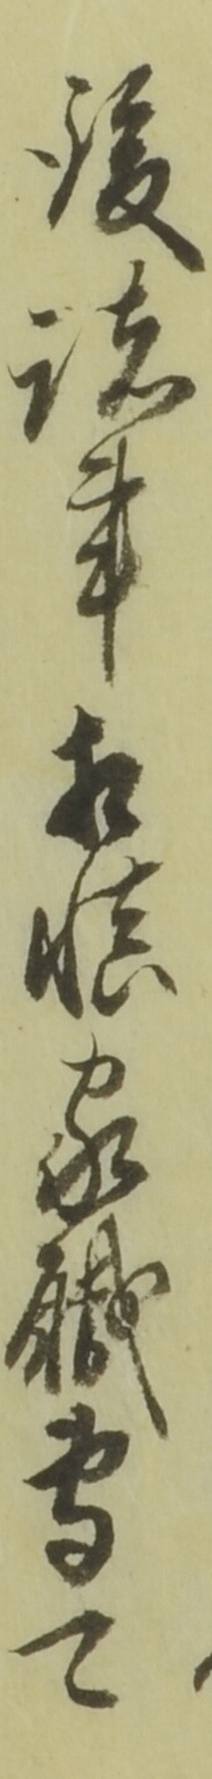後諸事相慎家職専可
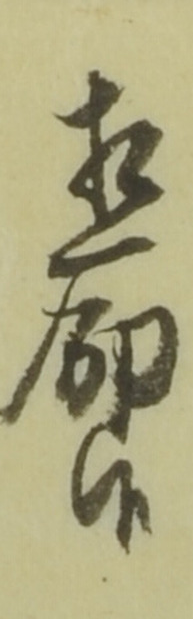相励候
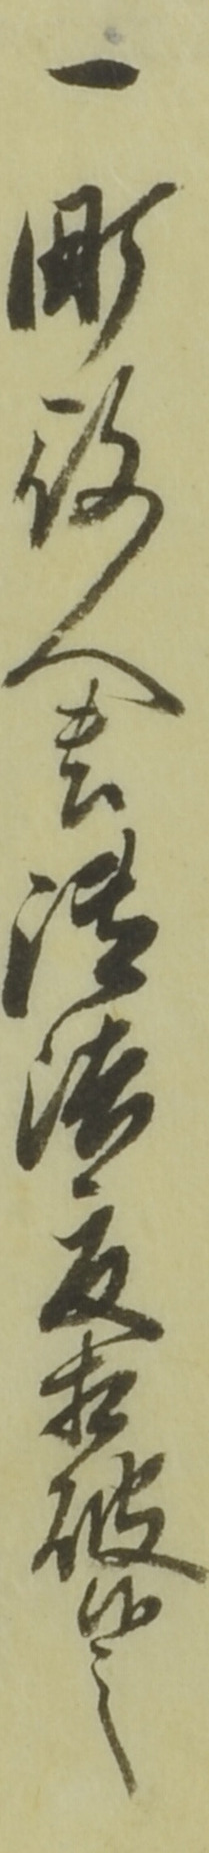一町役人共御法度相破候之
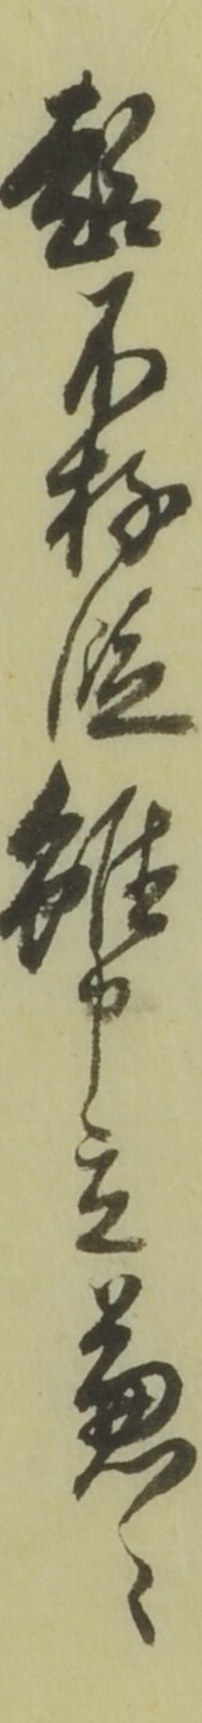趣不存段雖申立兼々
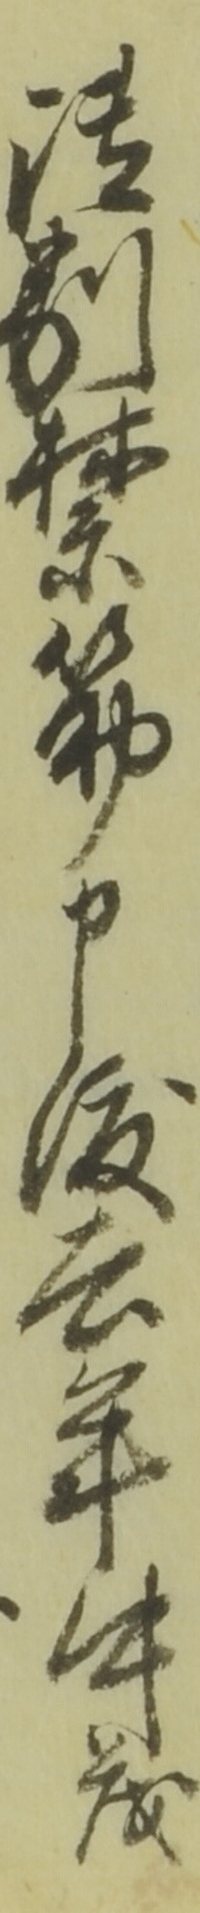御制禁筋申渡去年中も
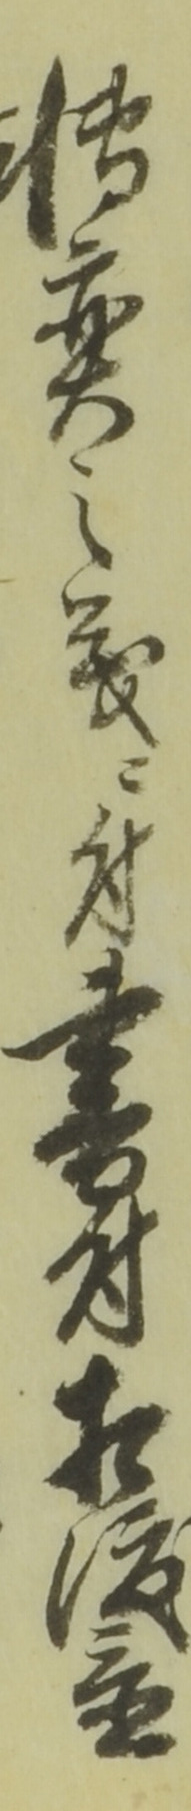博奕之義ニ付書付相渡置
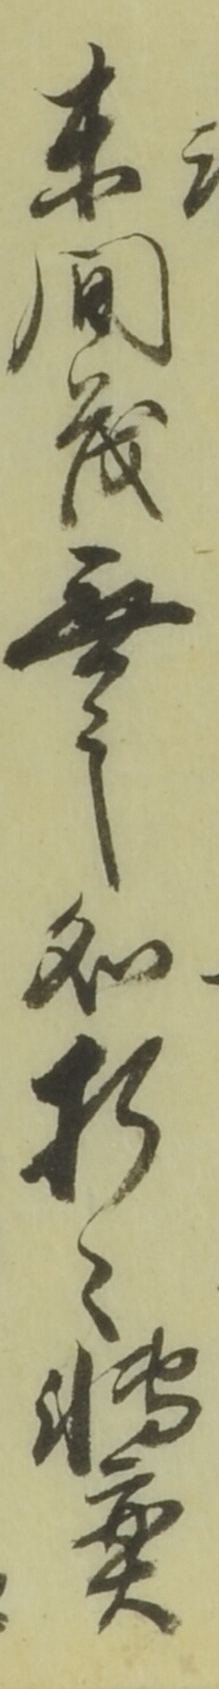未間も無之処折々博奕
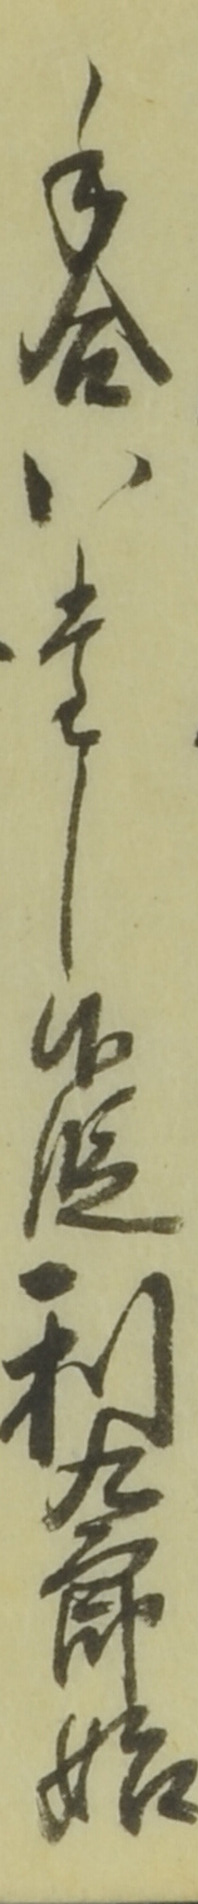手合いたし候段利九郎始
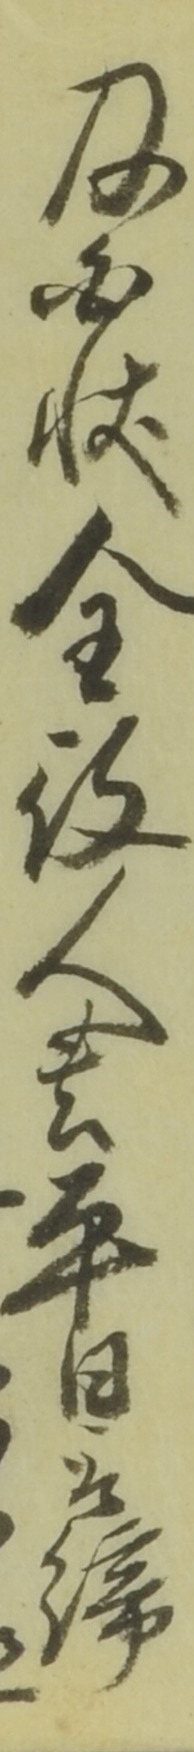及白状全役人共平日取締
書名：御触書御書附控
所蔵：伊那市立高遠町図書館・合同会社AMANE
